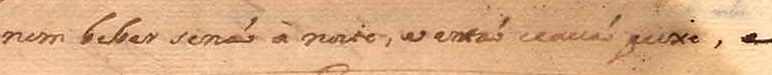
nem beber senaõ à noite, e entaõ ceauaõ peixe, e
